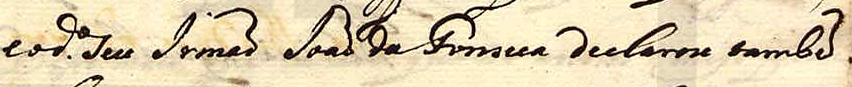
e o d.o seu Irmaõ Joaõ da Fonseca declarou tambē
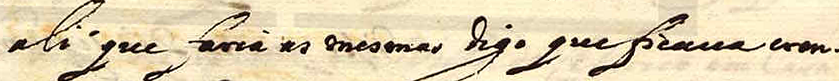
ali que faria as mesmas digo que ficaua cren
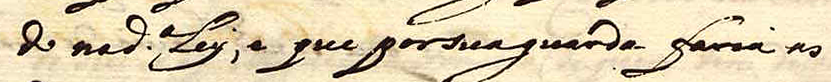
do na d.a Ley, e que por sua guarda faria as
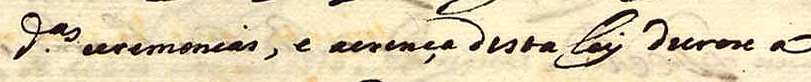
d.as ceremonias, e a crença desta ley durou a
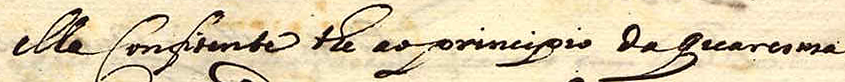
ella Confitente the ao principio da Quaresma
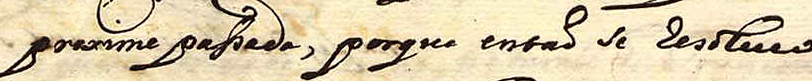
proxime passada, porque entaõ se Resolueo
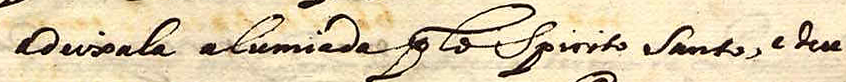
a deixala alumiada p̄lo Spirito Santo, e deu
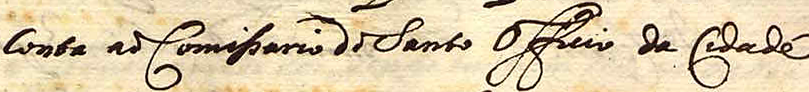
conta ao Comissario do Santo Officio da Cidade
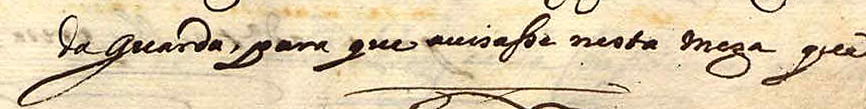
da Guarda, para que auisasse nesta meza que
